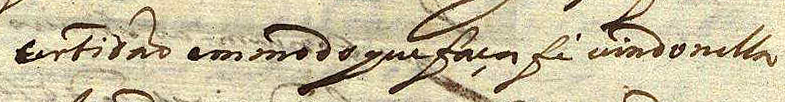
certidaõ em modo que faça fé uindo nella
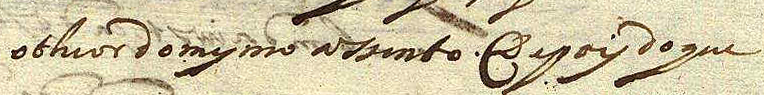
o theor do mesmo assento. Depois do que
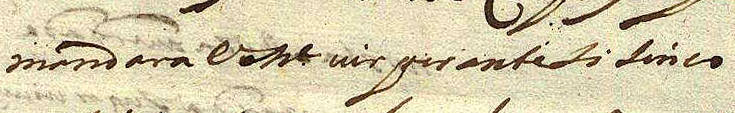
mandara V M.e uir perante si sinco
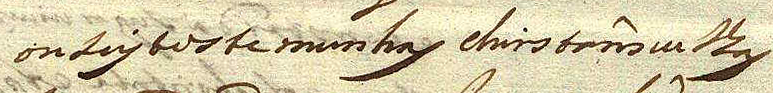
ou seis testemunhas christan̄s uelhas
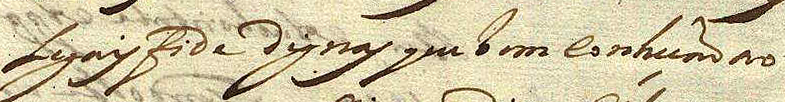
Legais fidedignas, que bem conheçaõ ao
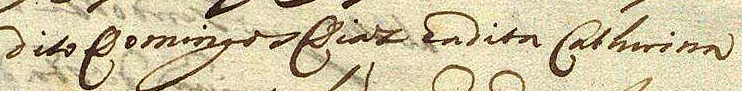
dito Domingos Diaz e a dita Catherina
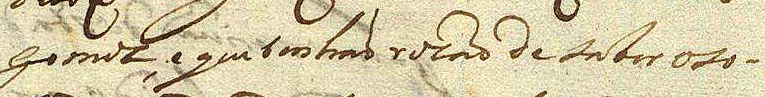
gomez, e que tenhaõ rezaõ de saber o so
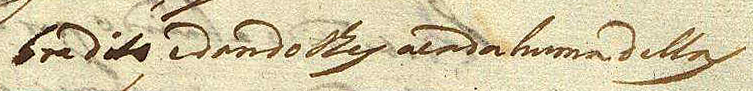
bredito, e dandolhes a cada huma dellas
